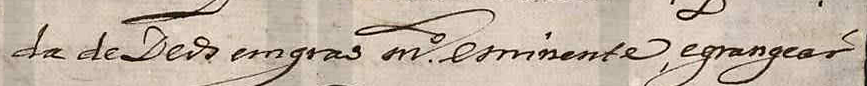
da de Deos em grao m.to eminente, e grangear
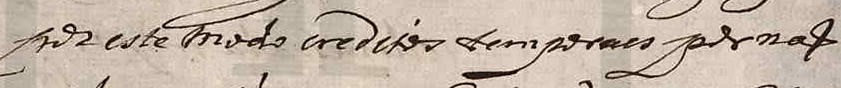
por este modo creditos temporaes por naõ
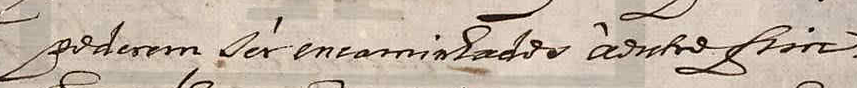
poderem ser encaminhados à outro fim
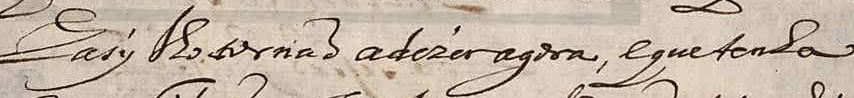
E asy lho tornaõ a dizer agora, e que tenha
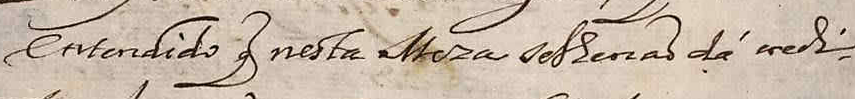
entendido q̄ nesta Meza se lhe naõ dá credi
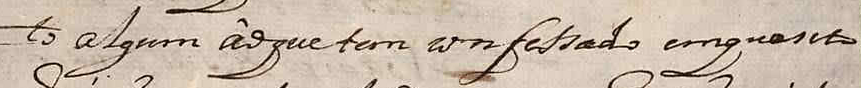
to algum ào que tem confessado em quanto
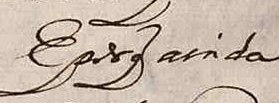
E porq̄ ainda
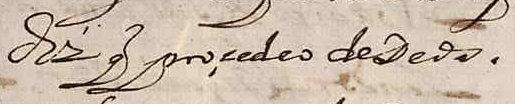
diz q̄ procedeo de Deos.
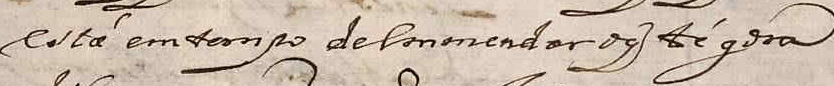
está em tempo de emmendar o q̄ té gora
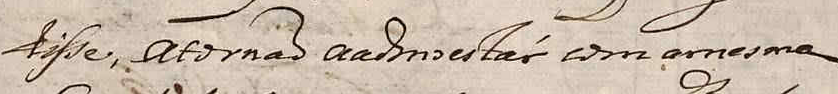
disse, a tornaõ a admoestar com a mesma
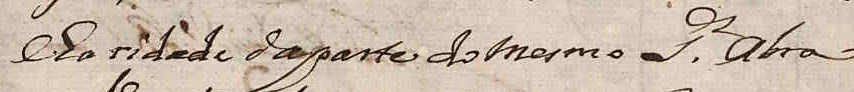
charidade da parte do mesmo S.or abra
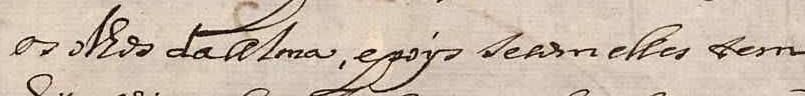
os olhos da alma, e poys se com elles tem
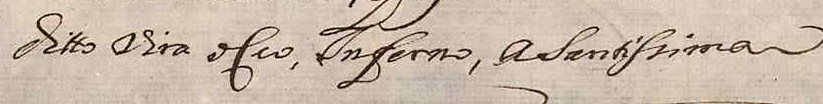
ditto vira o Ceo, Inferno, a Santissima
